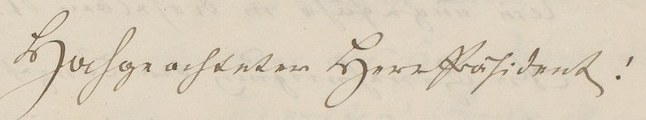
Hochgeachteter Herr Präsident!
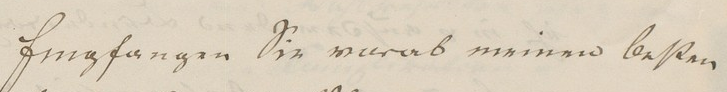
Empfangen Sie vorab meinen besten
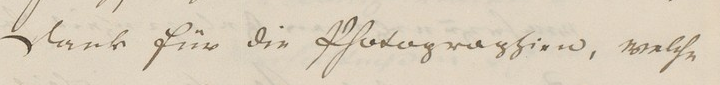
Dank für die Photographien, welche
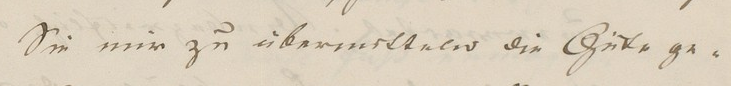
Sie mir zu übermittelns die Güte ge-
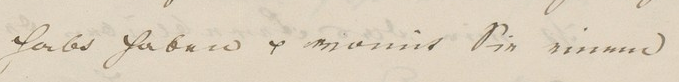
habt haben & womit Sie einem
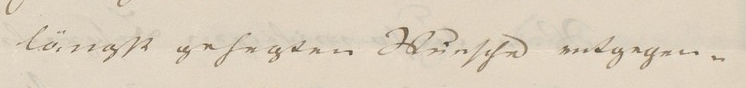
längst gehegten Wünsche entgegen-
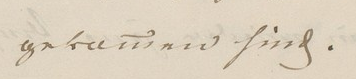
gekommen sind. –
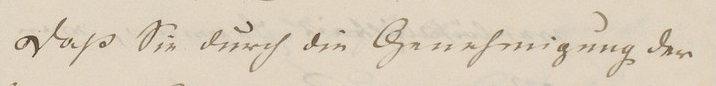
Daß Sie durch die Genehmigung der
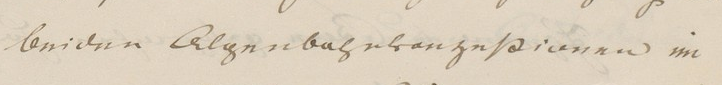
beiden Alpenbahnkonzessionen im
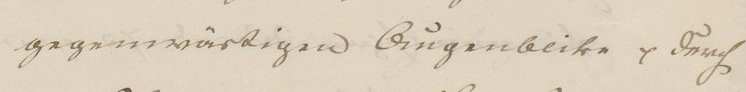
gegenwärtigen Augenblike & durch
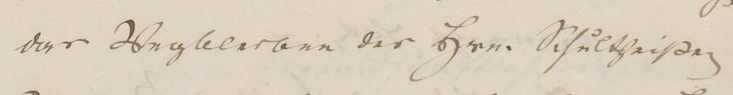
das Wegbleiben des Hrn. Schultheißen
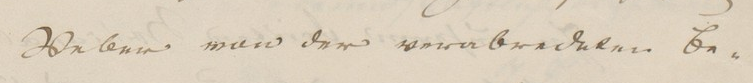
Weber von der verabredeten Be-
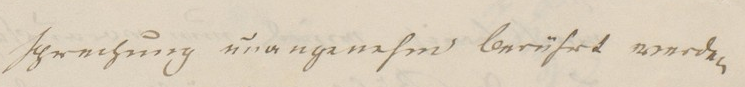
sprechung unangenehm berührt werden
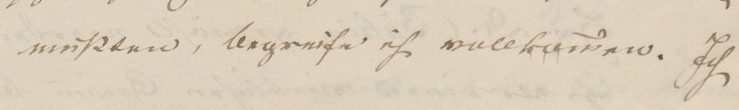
mußten, begreife ich vollkommen. Ich
